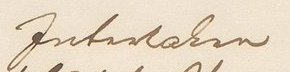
Interlaken
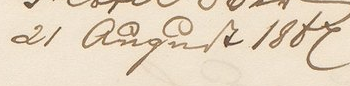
21 August 1867
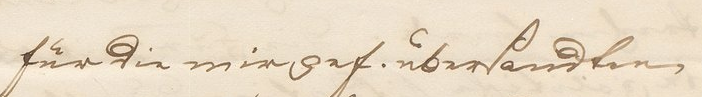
Für die mir gef. übersandten
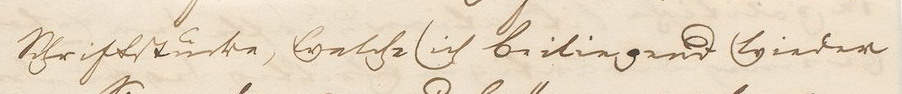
Schriftstücke, welche ich beiliegend wieder
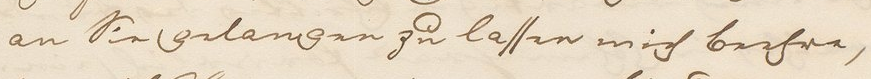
an Sie gelangen zu lassen mich beehre,
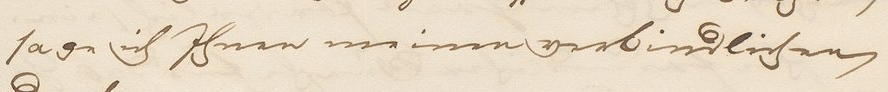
sage ich Ihnen meinen verbindlichen
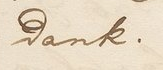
Dank.
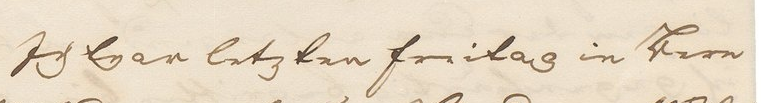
Ich war letzten Freitag in Bern
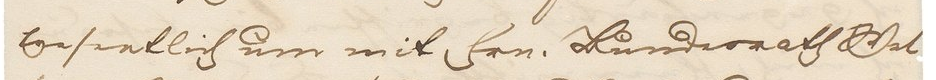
wesentlich um mit Hrn. Bundesrath Wel-
